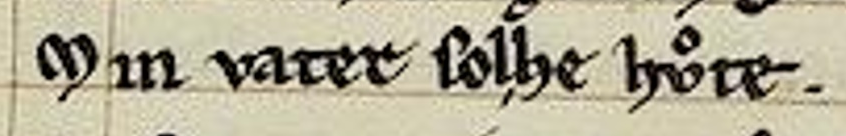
Min vater ſolhe hv°ote.
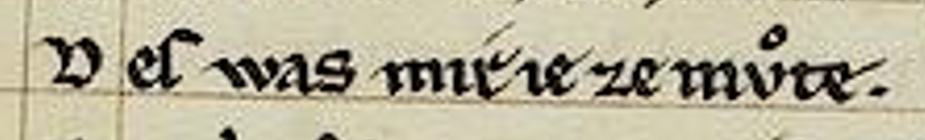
Deſ was mir ie ze mv°ote.
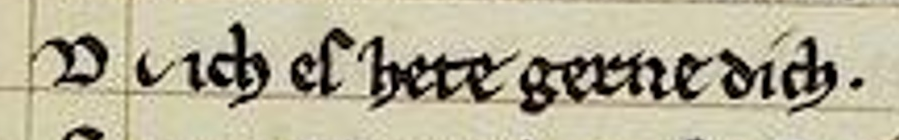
D(az) ich eſ hete gerne dich.
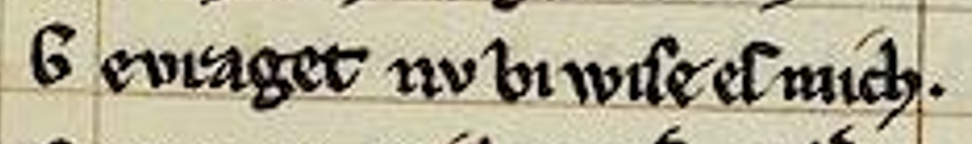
Gevraget nv bi wiſe eſ mich.
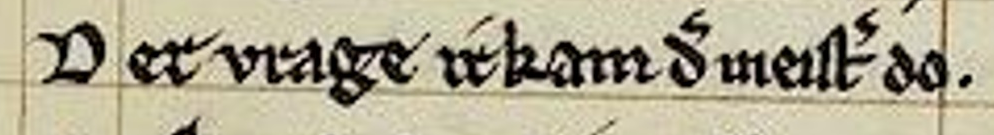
Der vrage irkam d(er) meiſt(er) do.
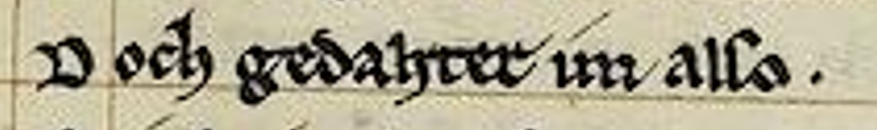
Doch gedahter im alſo.
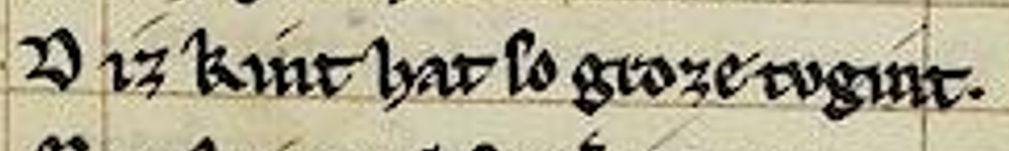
Diz kint hat ſo groze tvgint.
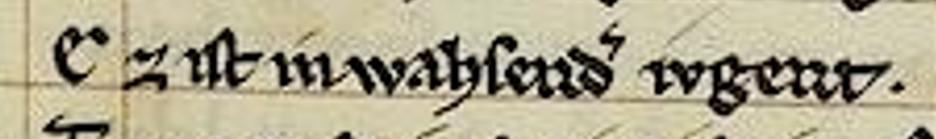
Ez iſt in wahſend(er) ivgent.
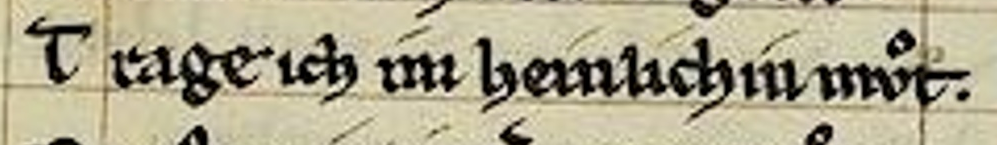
Trage ich im heinlichin mv°ot.
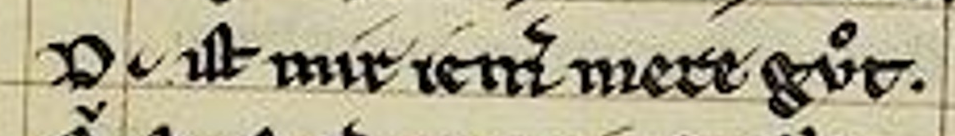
D(az) iſt mir iem(er) mere gv°ot.
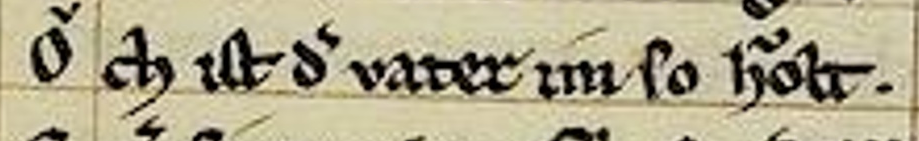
O°vch iſt d(er) vater im ſo ho°vlt.
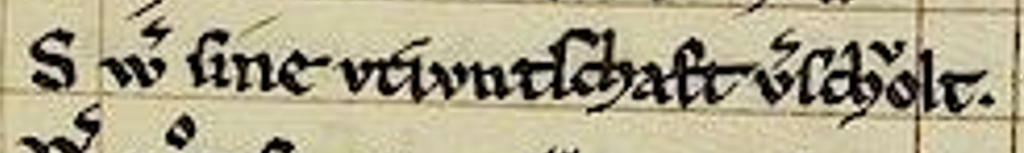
Sw(er) ſine vrivntſchaft v(er)ſcho°vlt.
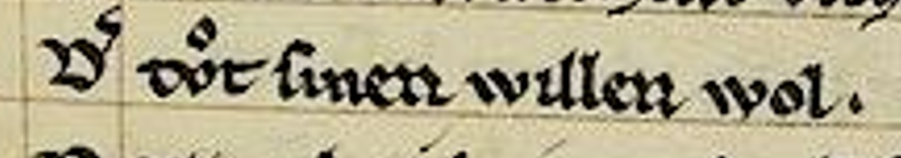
D(er) tv°ot ſinen willen wol.
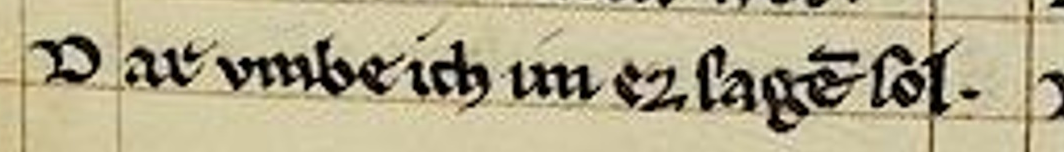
Dar vmbe ich im ez ſage(n) ſol.
